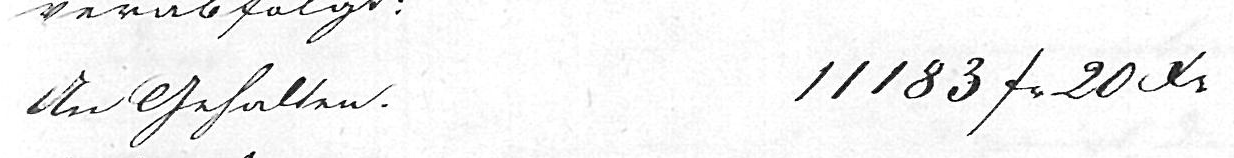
An Gehalten. 11138 fl 20 kr
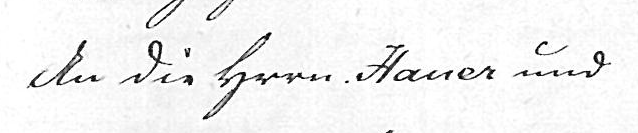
An die Herrn Hauer und
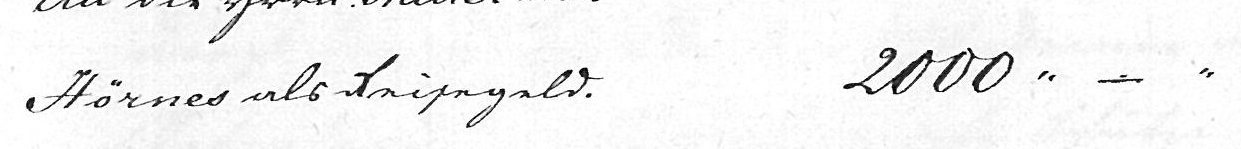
Hörnes als Reisegeld. 2000 " - "
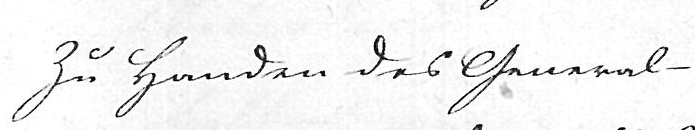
zu Handen des General-
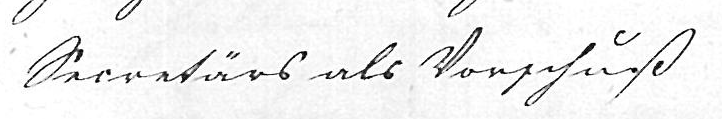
Secretärs als Vorschluß
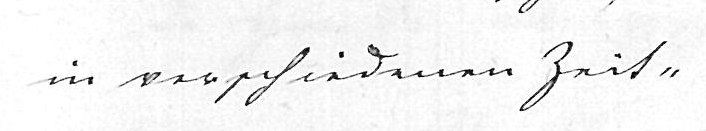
in verschiedenen Zeit
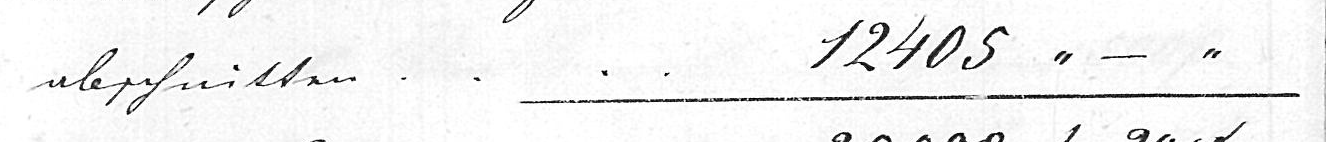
abschnitten . . . . . 12405 " - "
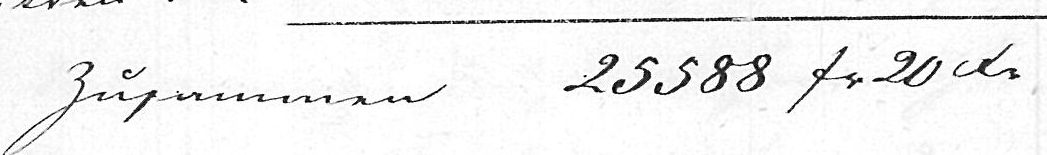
Zusammen 25588 fr 20 kr
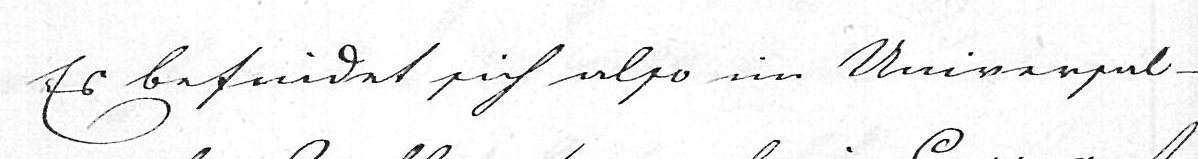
Es befindet sich also im Univeral-
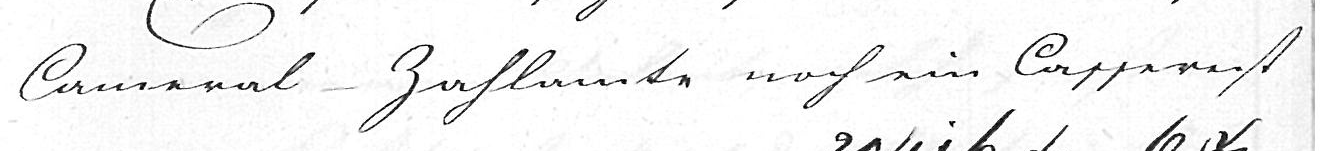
Cameral-Zahlamte noch ein Casserest
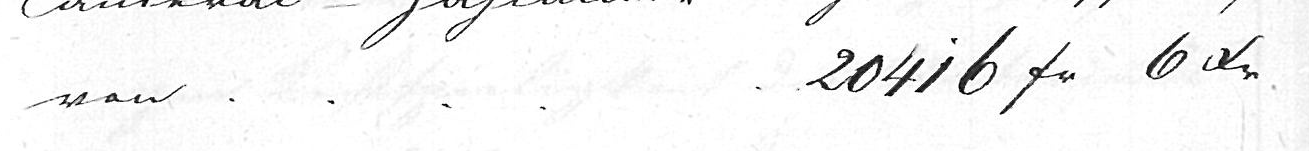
von . . . . . 20416 fr 6 kr
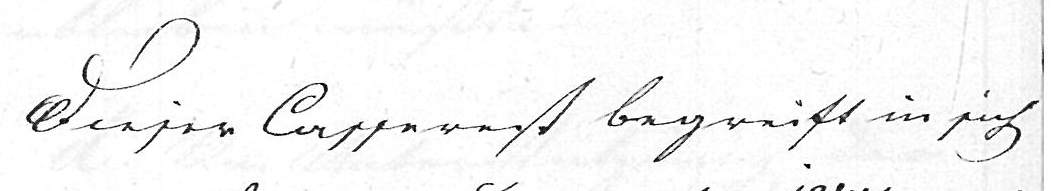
Dieser Cassarest begreift in sich
